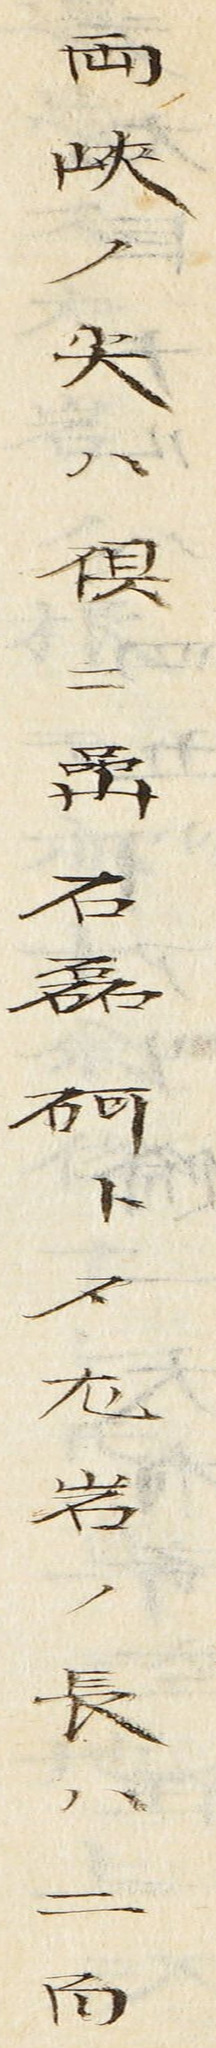両峡ノ尖ハ倶ニ嵒石磊砢トシテ左岩ノ長ハ二百
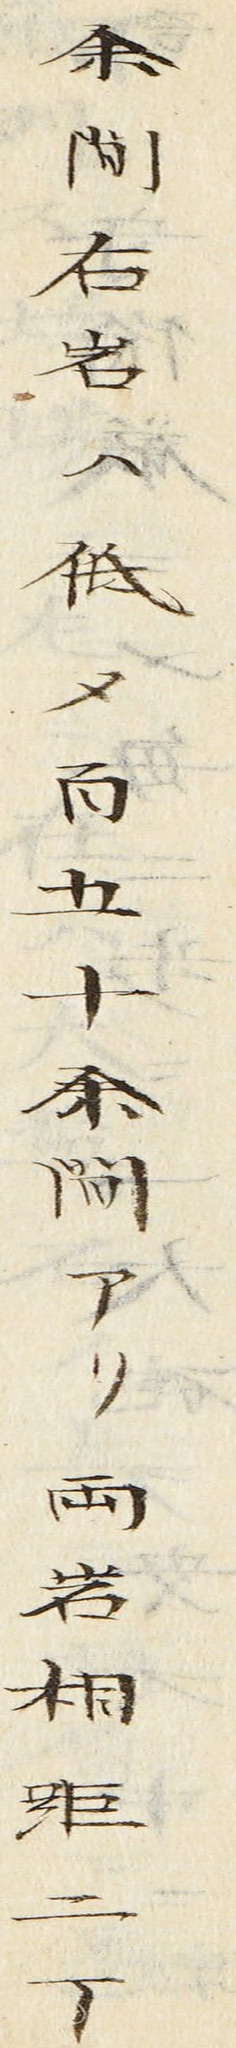余間右岩ハ低シテ百五十余間アリ両岩相距二丁
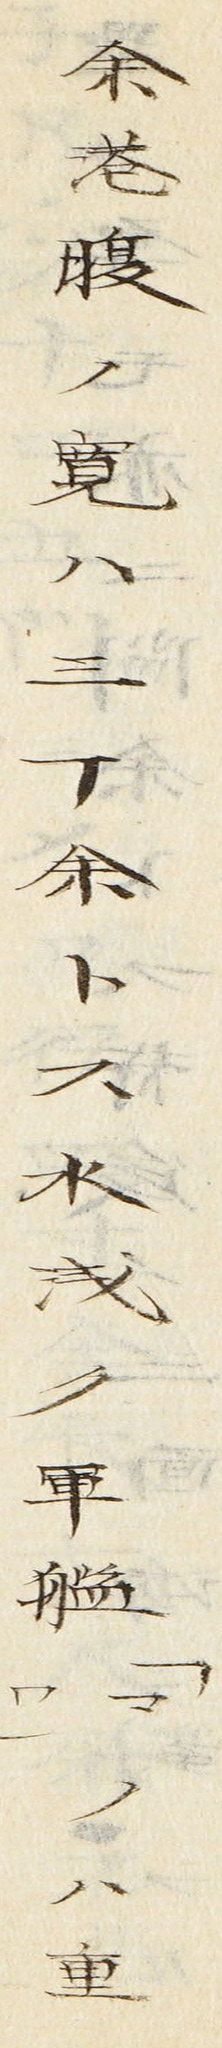余港腹ノ寛ハ三丁余トス水浅ク軍艦「マロ」ノハ重
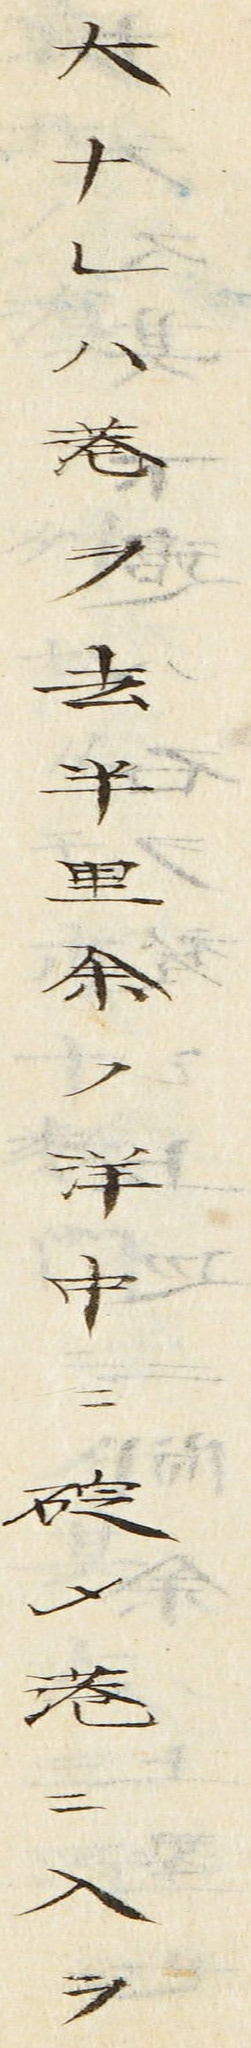大ナレハ港ヲ去半里余ノ洋中ニ碇シテ港ニ入ラ
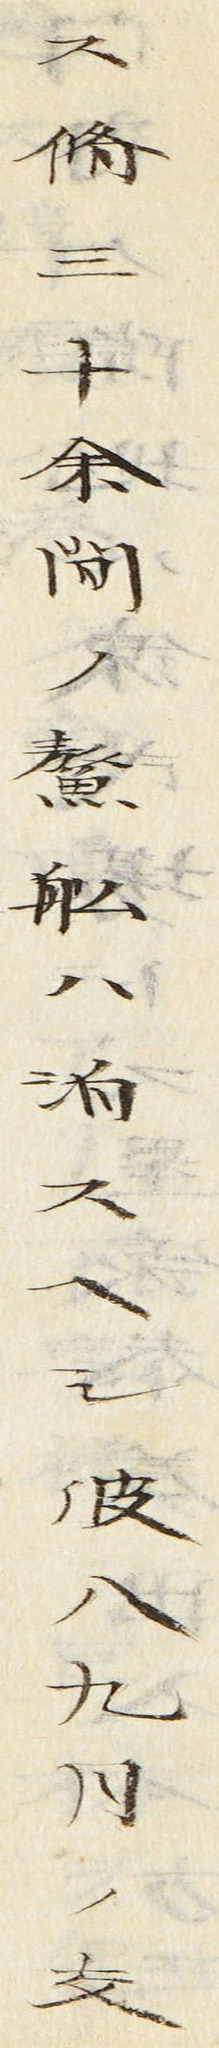ス脩三十余間ノ鰲舩ハ泊スヘシ彼八九月ノ交？
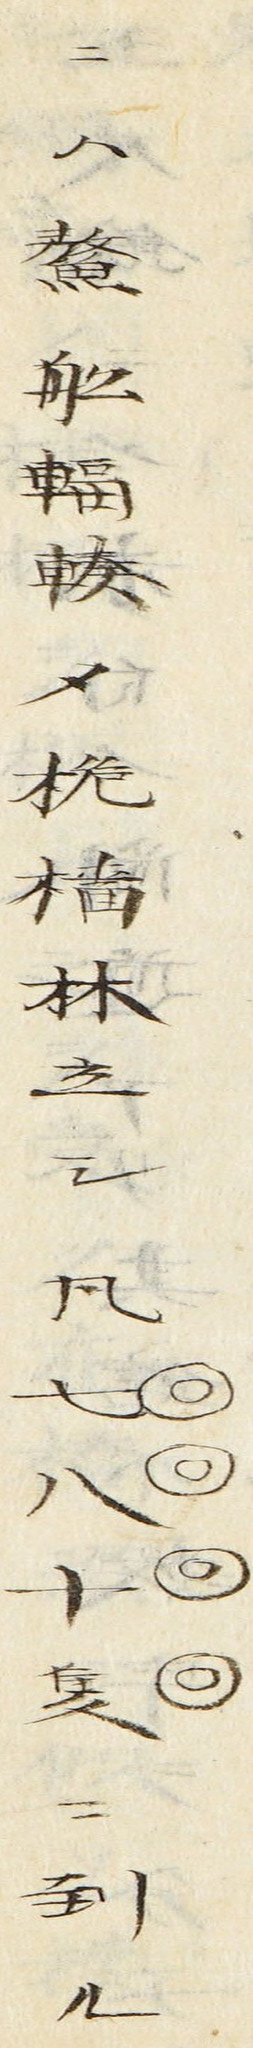ニハ鰲舩輻輳シテ桅檣林立シ凡七八十隻ニ到ル
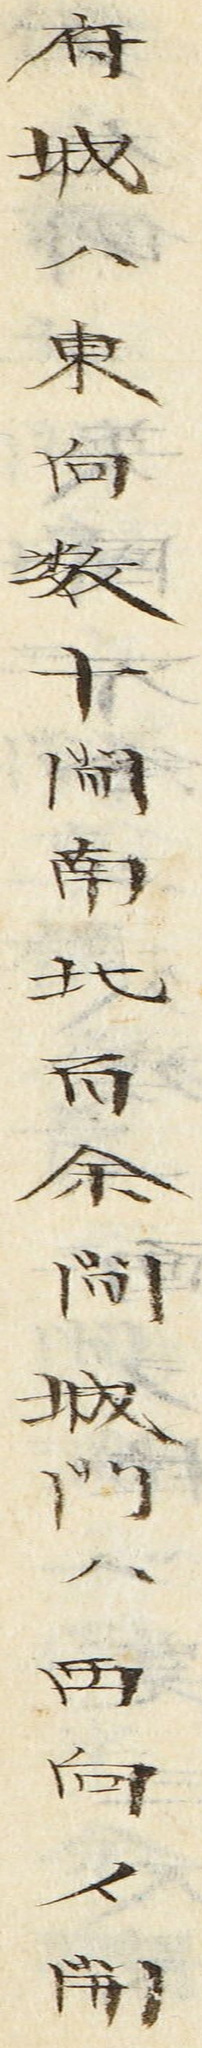府城ハ東向数十間南北百余間城門ハ西向シテ開

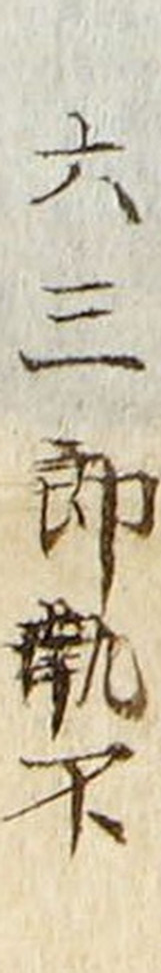六三即執不

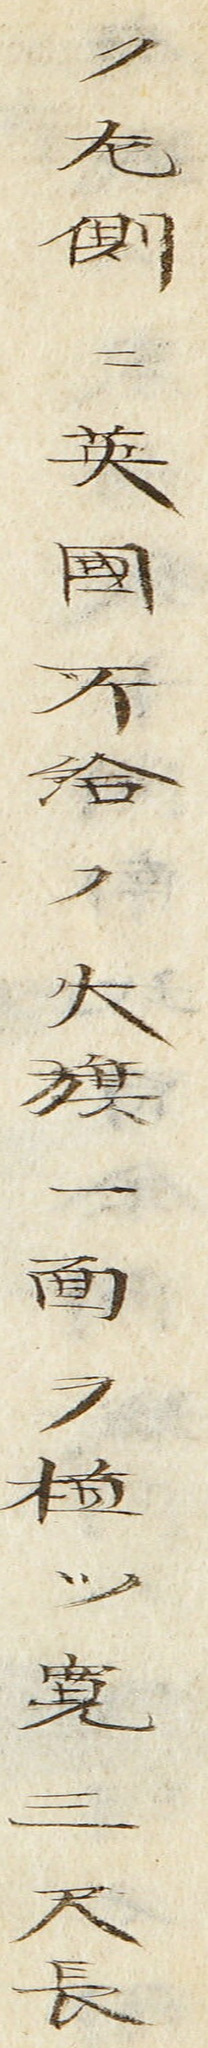ク左側ニ英国所給ノ大旗一面ヲ植ツ寛三尺長
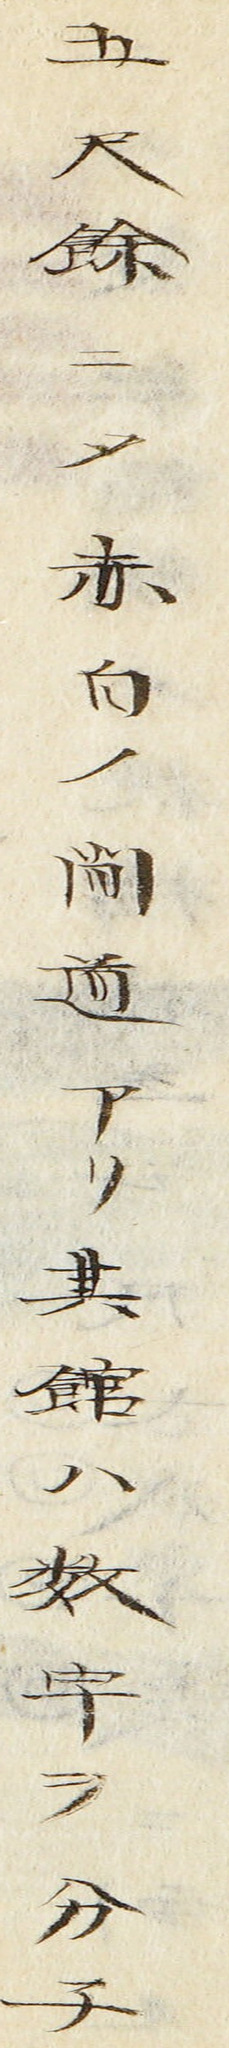五尺余ニシテ赤白ノ間道アリ其館ハ数宇ヲ分子
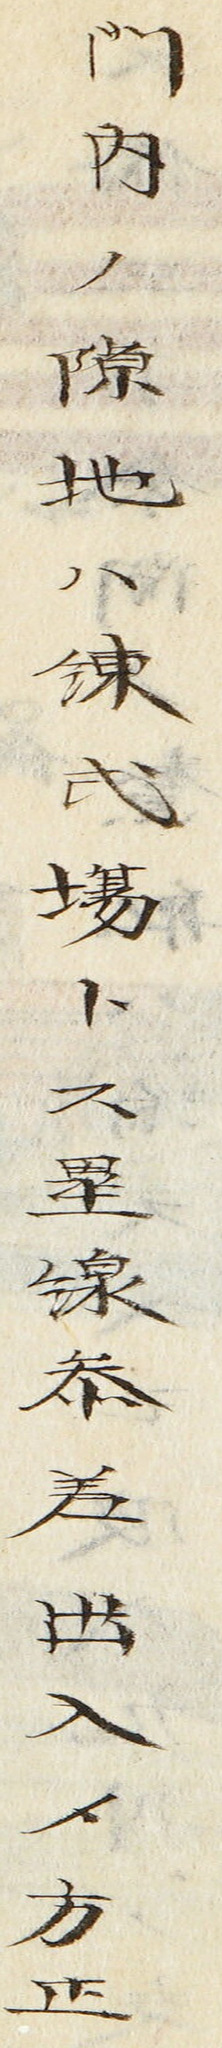門内ノ隙地ハ錬武場トス塁線参差出入シテ方正
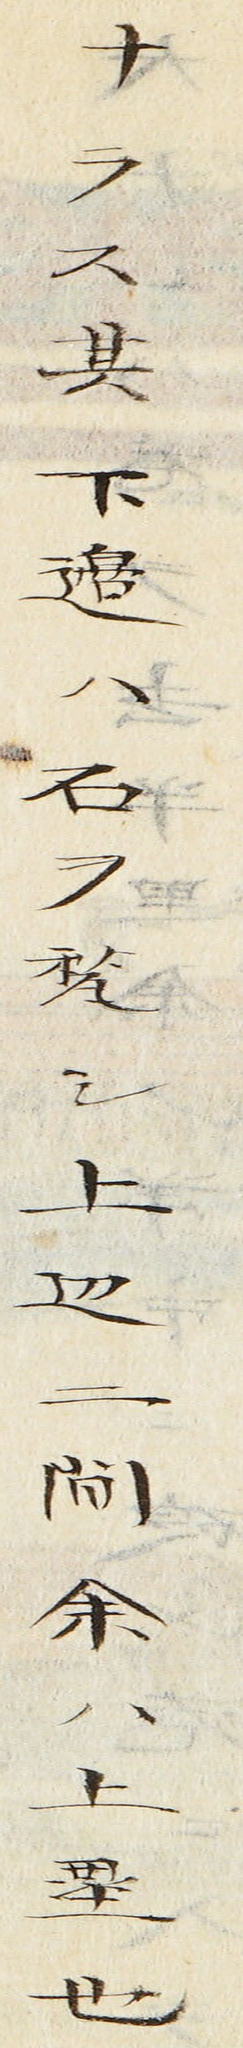ナラス其下邉ハ石ヲ甃シ上辺二間余ハ上塁也
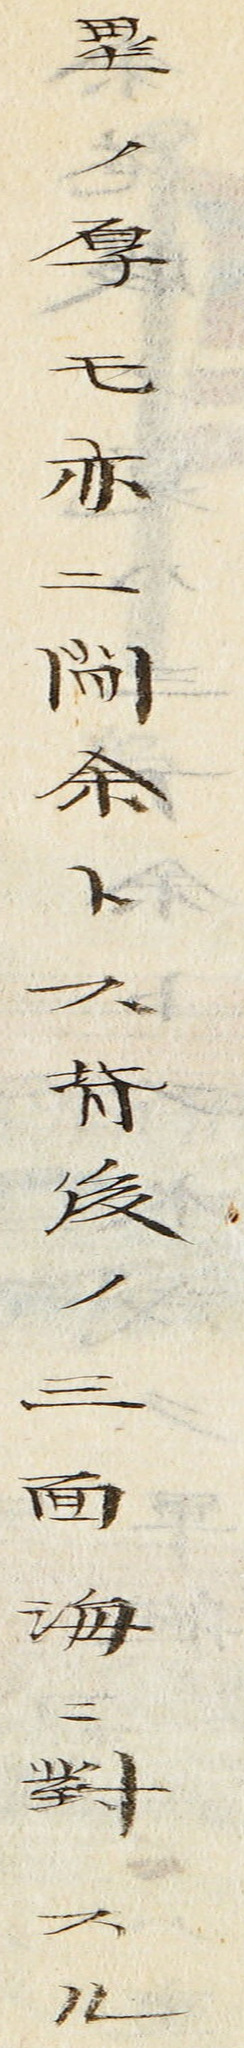塁ノ厚モ亦二間余トス背後ノ三面海ニ對スル
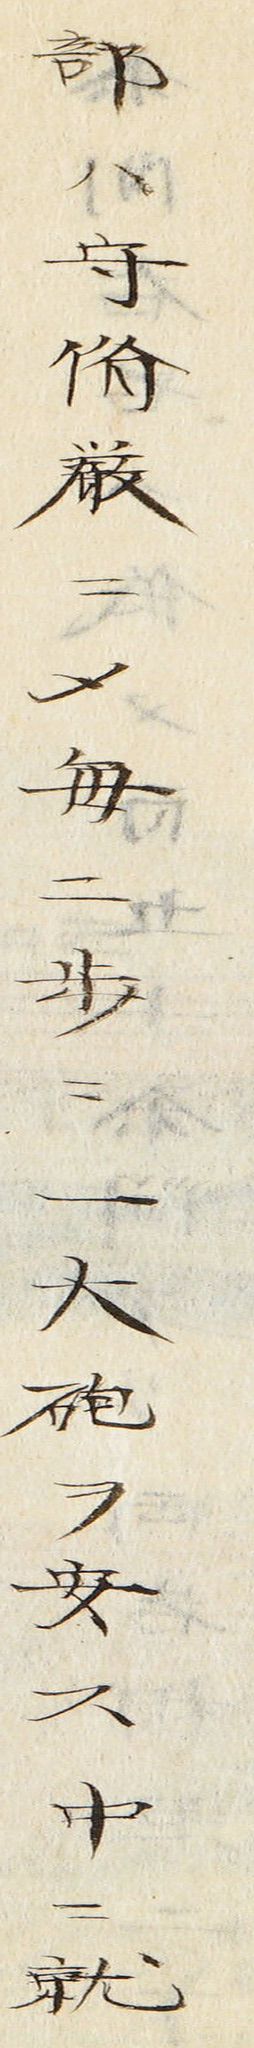部ハ守脩厳ニシテ毎ニ歩ニ一大砲ヲ安ス中ニ就
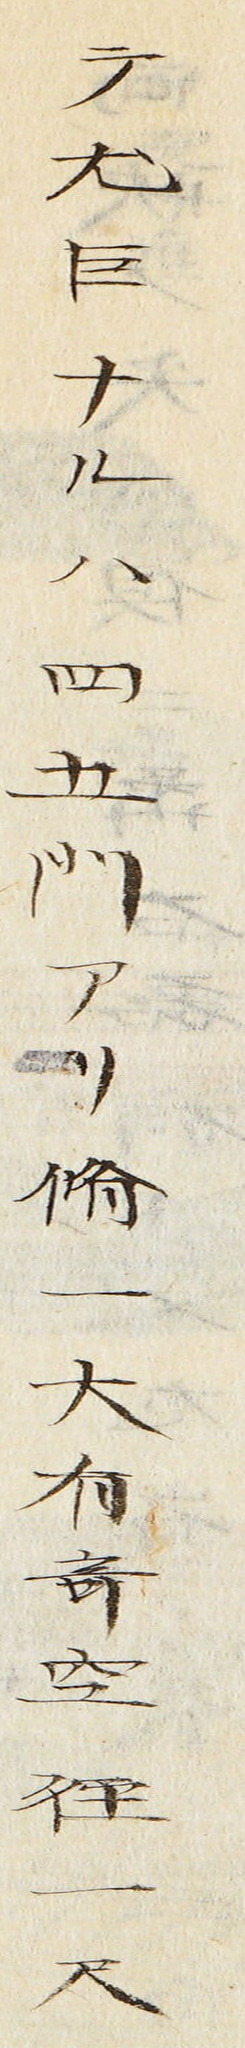テ尤巨ナルハ四五門アリ脩一大有奇空径一尺
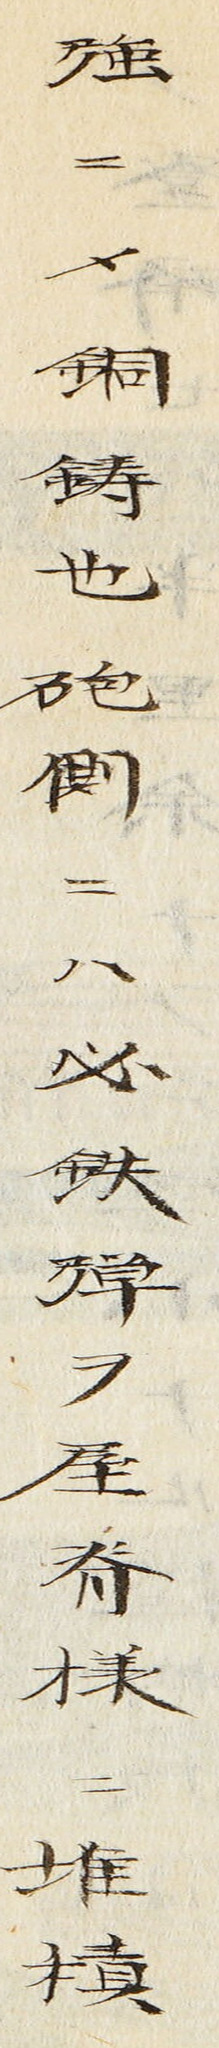強ニシテ銅鋳也砲側ニハ必鉄弾ヲ屋脊様ニ堆積
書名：蕃談
